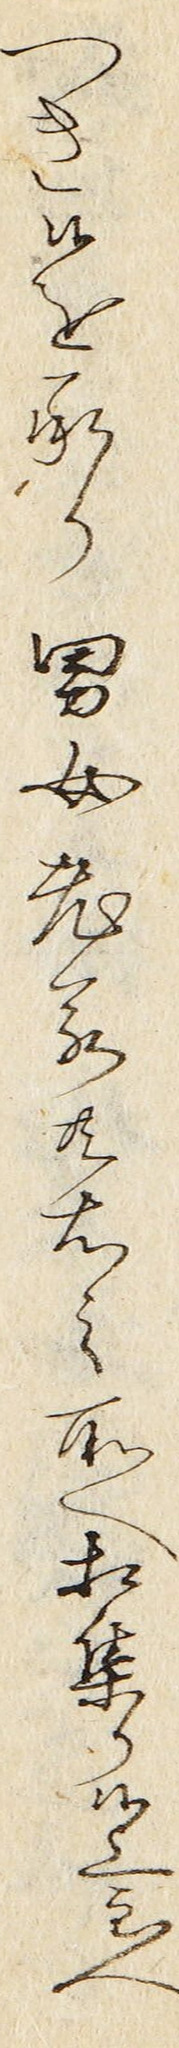つき候を承り男女老若共右之所へ相集り候上主人
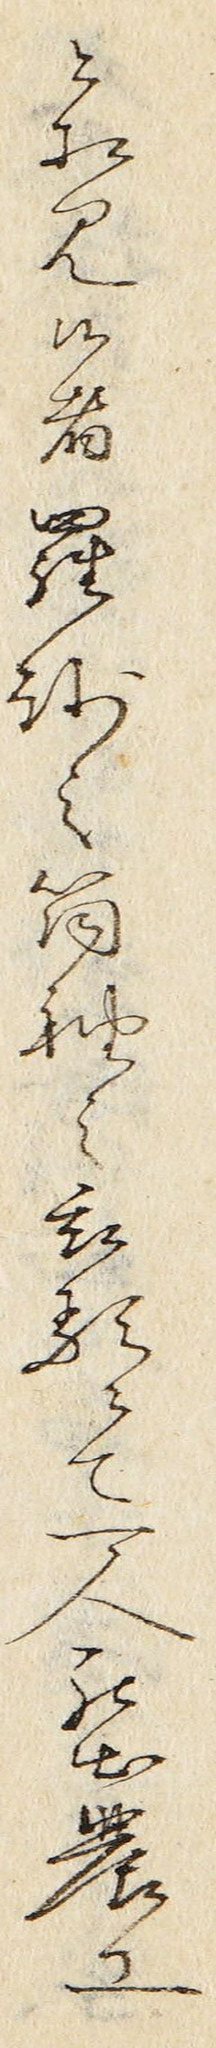と相見候者羅紗之筒袖之衣類にて一人罷出農工
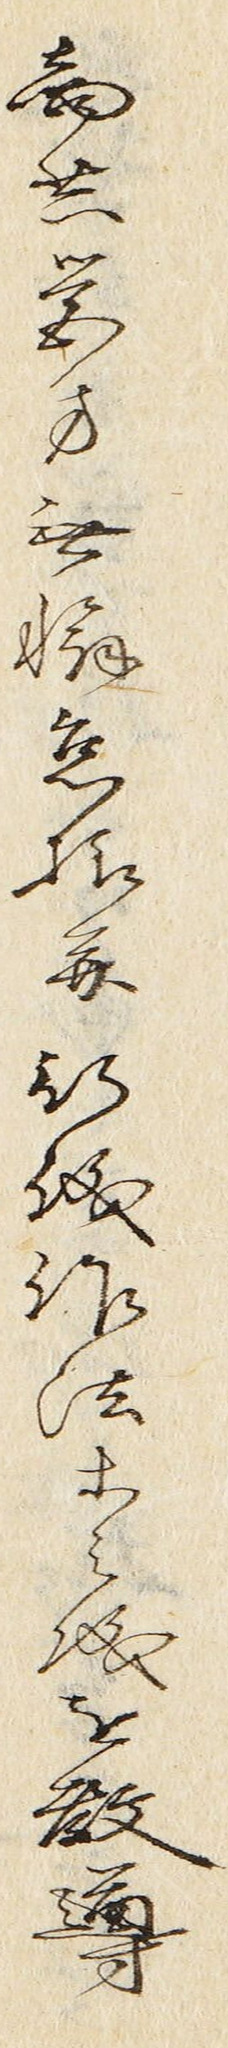商共営方無懈怠様并行儀作法等之儀を教導
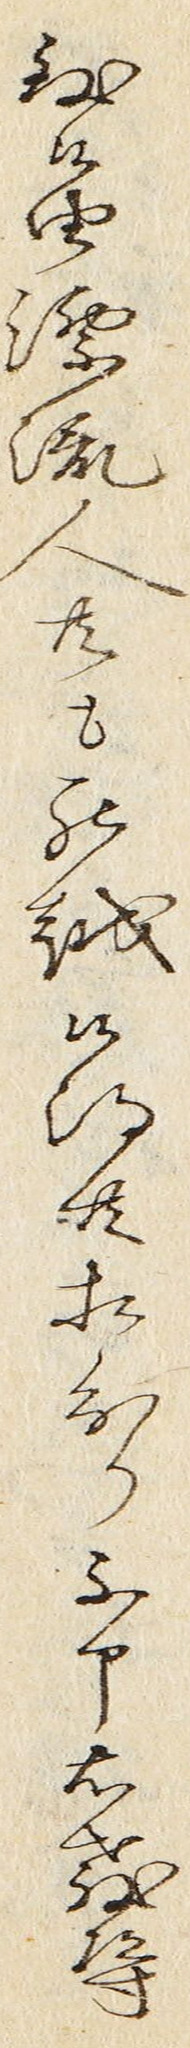致候由漂流人共も罷越候得共相分不申右教導
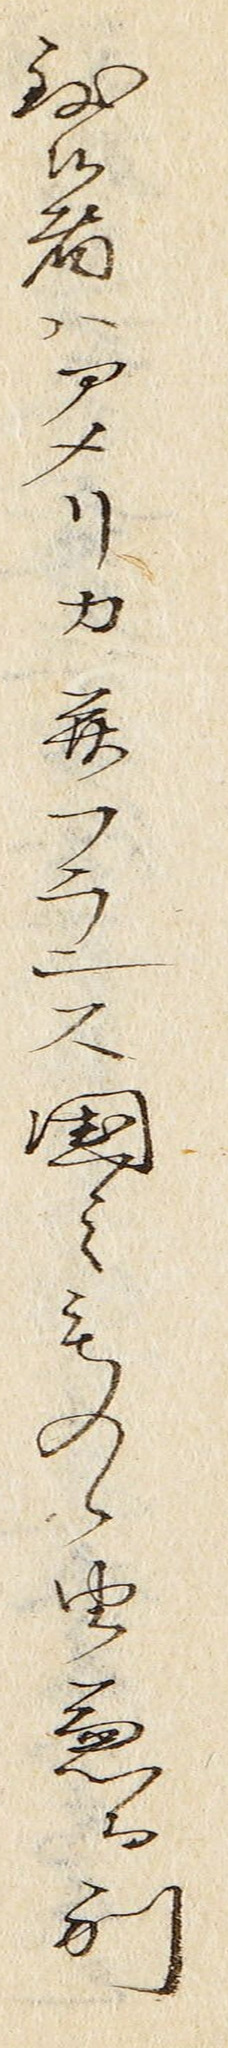致候者はアメリカ并フランス国之ものゝ由兼而別
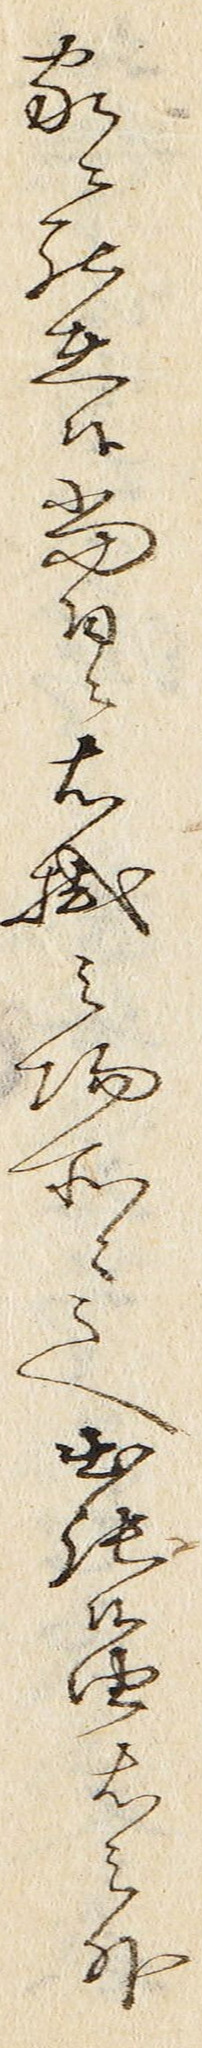家に罷在候当日に右掛之場所へ出張候由右之外
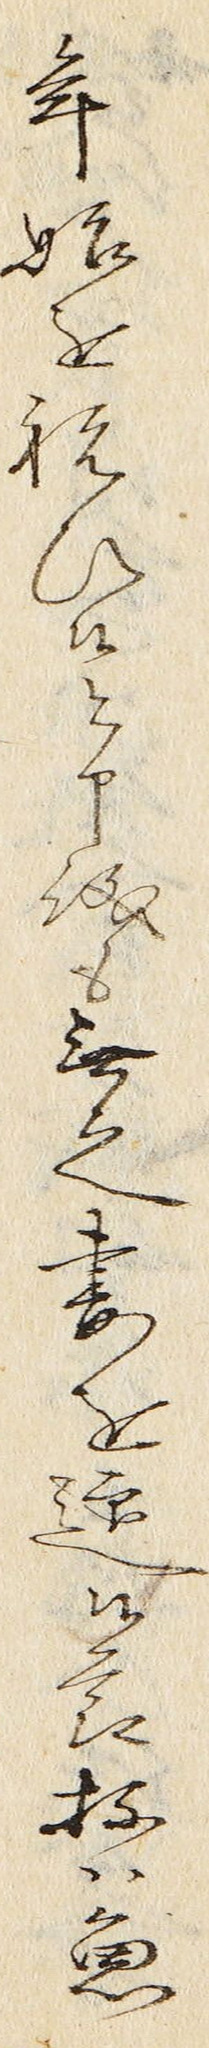年始を祝ひ候と申す儀も無之妻を迎候節抔は魚
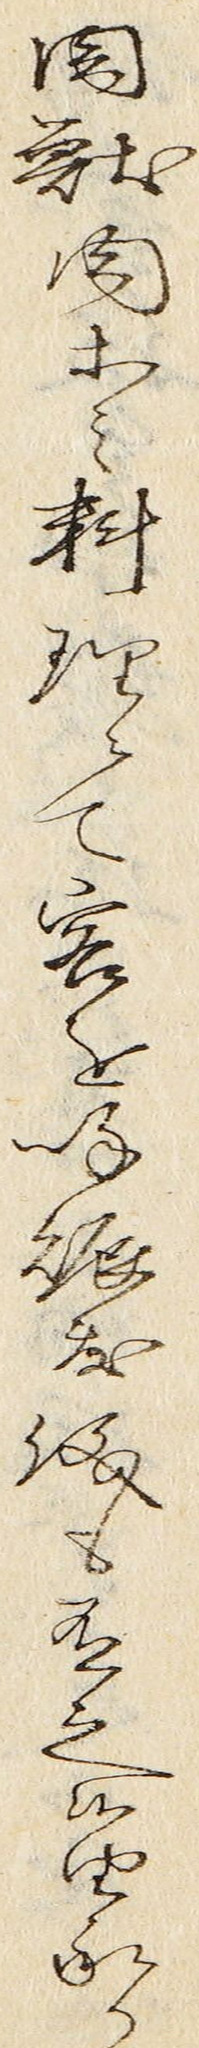肉獣肉等之料理にて客を呼賑敷儀も有之候由承り
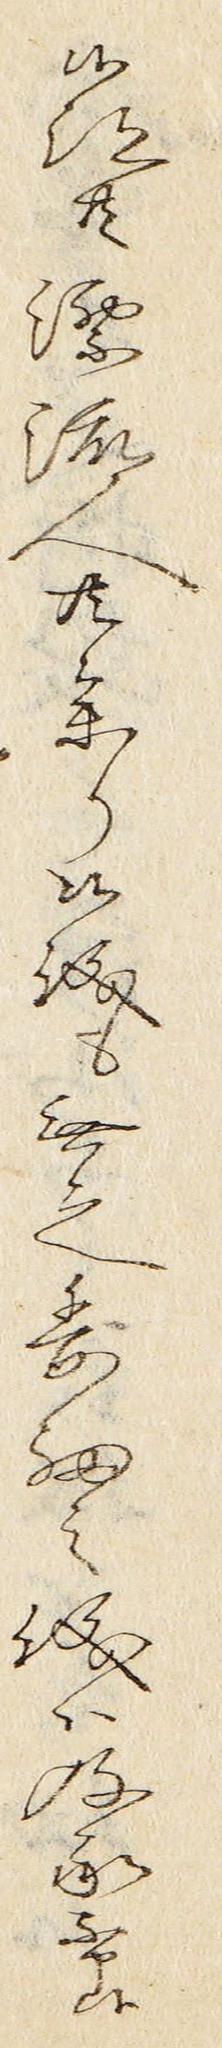候得共漂流人共参り候儀も無之委細之儀は及承不申候
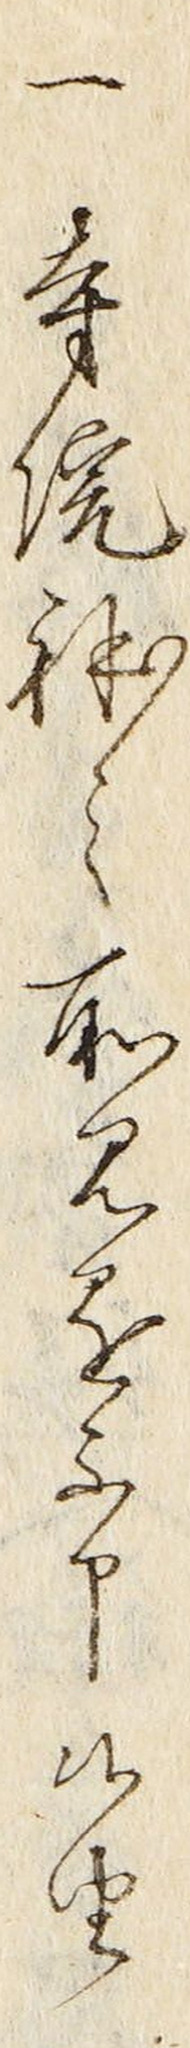一寺院躰之所見懸不申候由
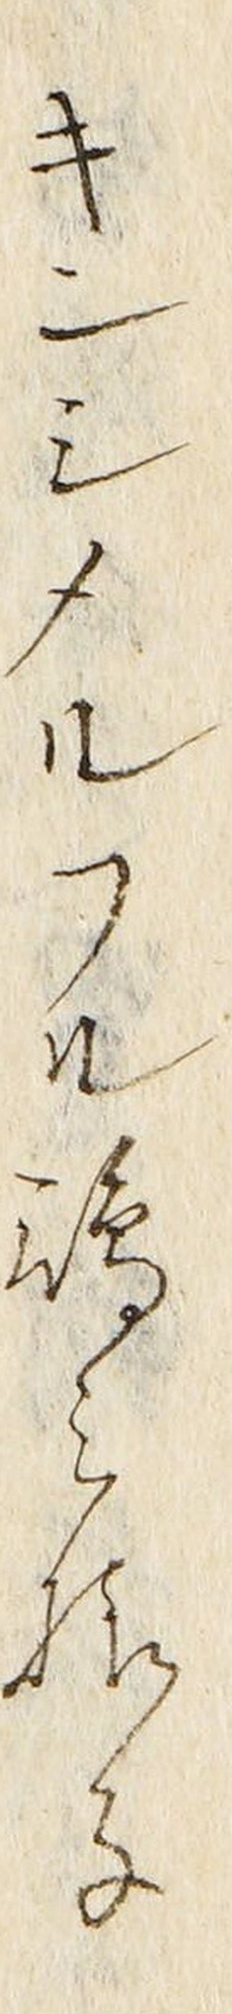キンシメルフル嶋之様子
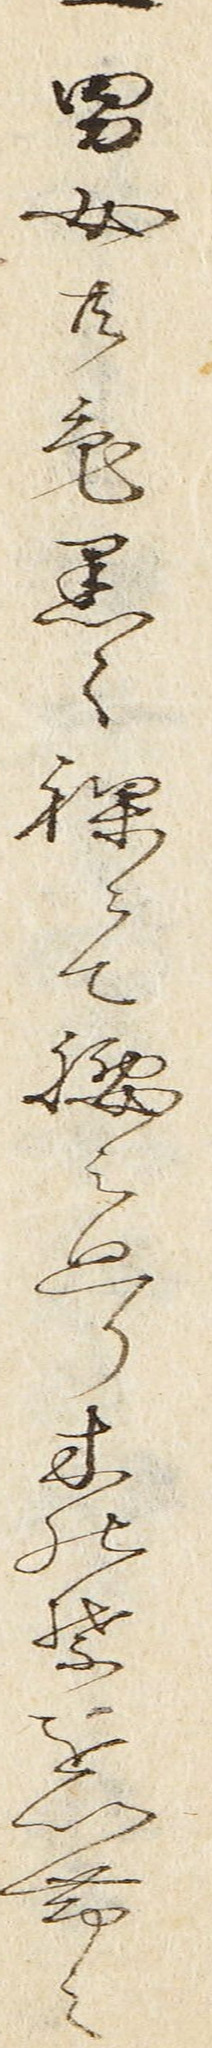一男女共色黒く裸にて腰之廻り木の葉を以帯之
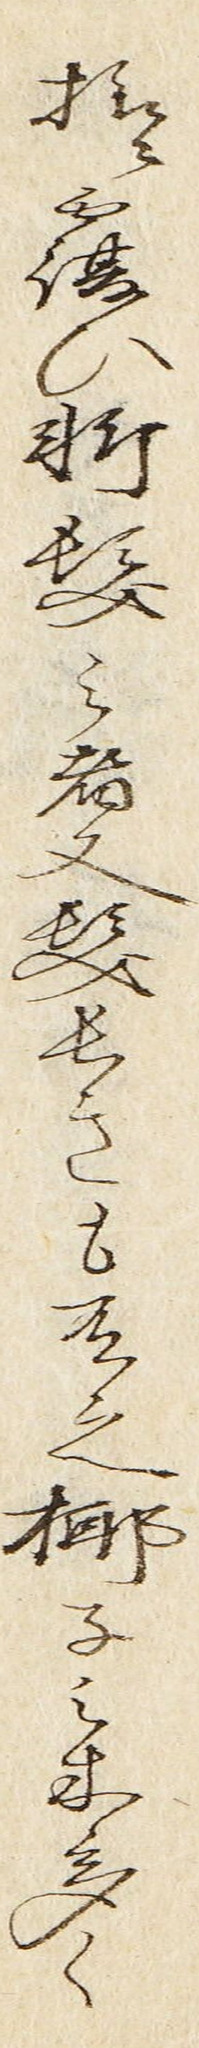様に覆ひ斬髪之者又髪長きも有之椰子之木多く
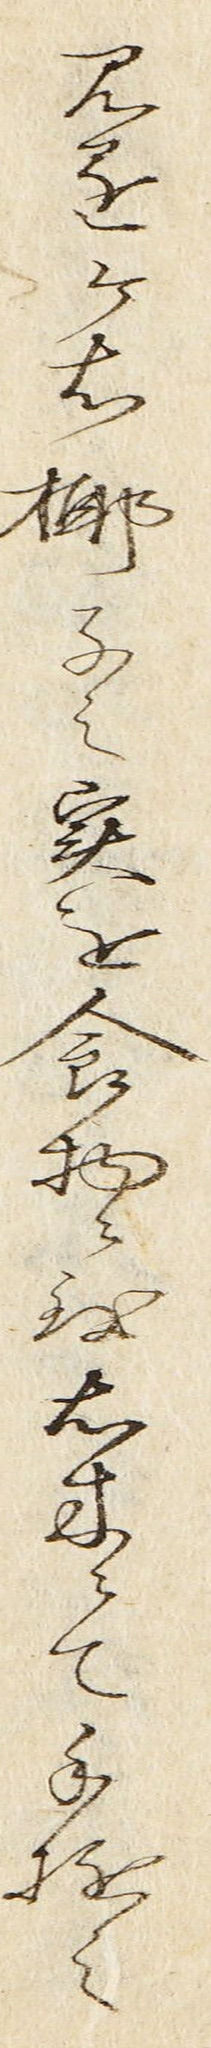見懸け右椰子之実を食物に致右木にて手遊之
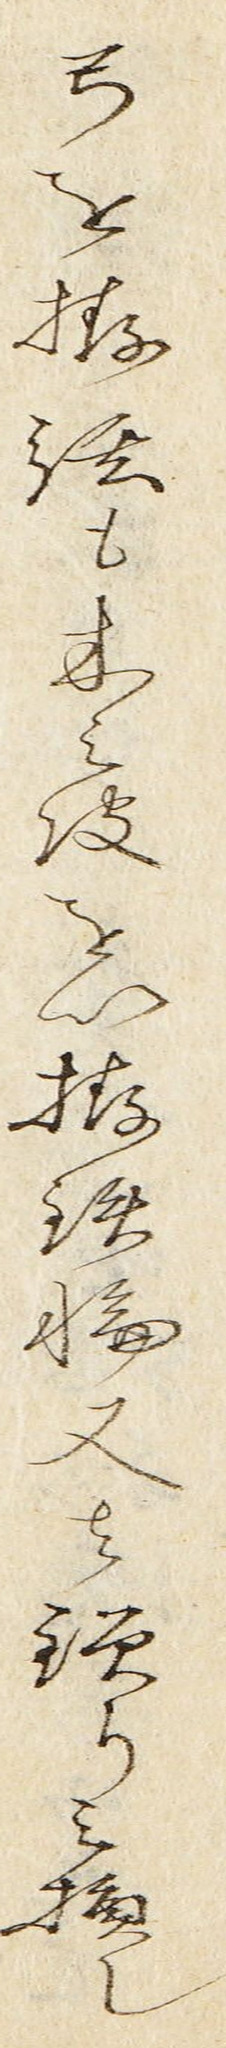弓を拵弦も木之皮を以拵鉄輪又は鎖り之損し
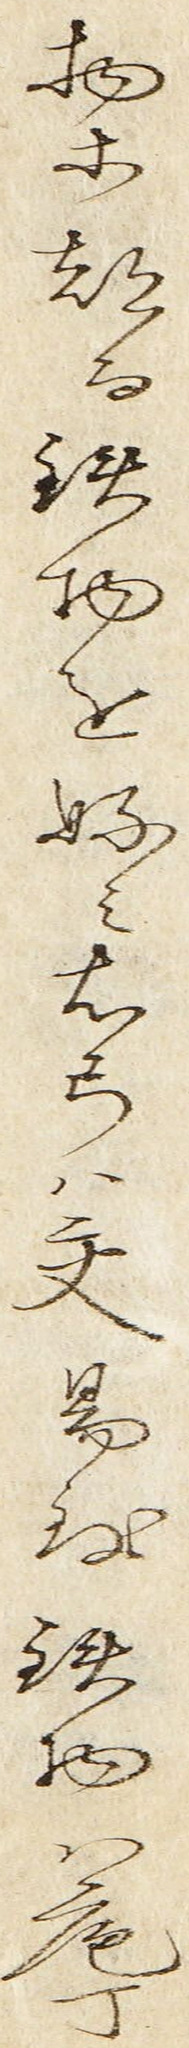物等都而鉄物を好み右弓は交易致鉄物は庖丁
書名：土佐中浜万次郎漂流記
